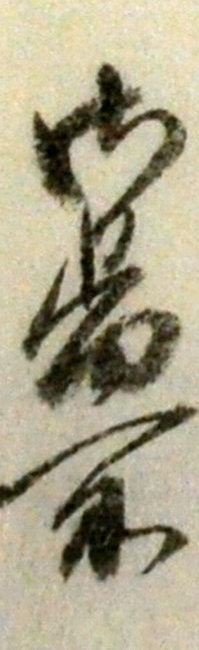御番所
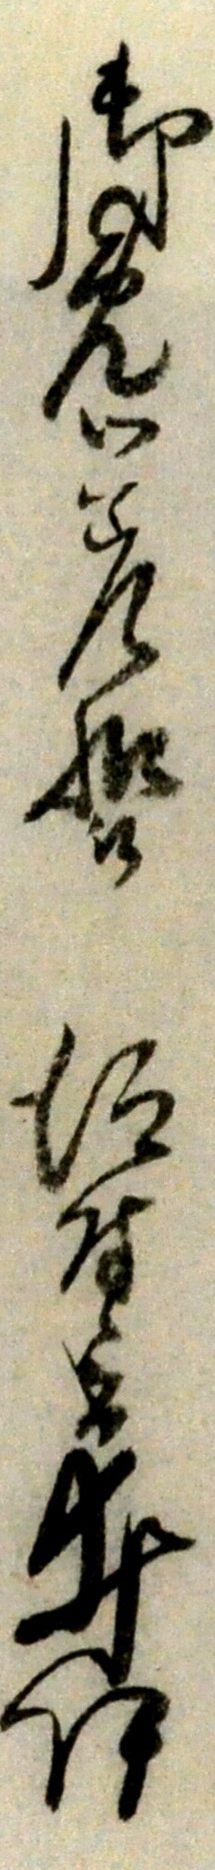御免御差控被仰付候旨井伊
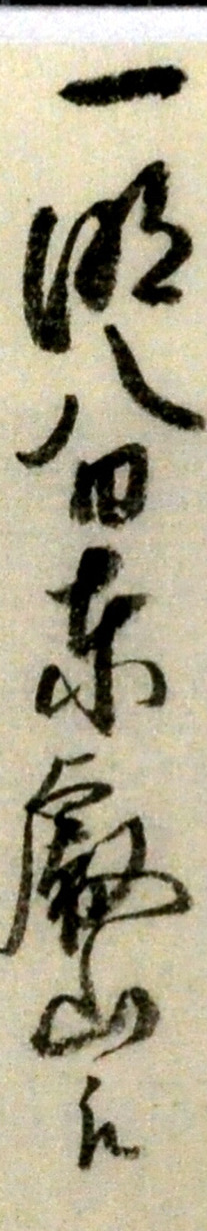一明八日東叡山え
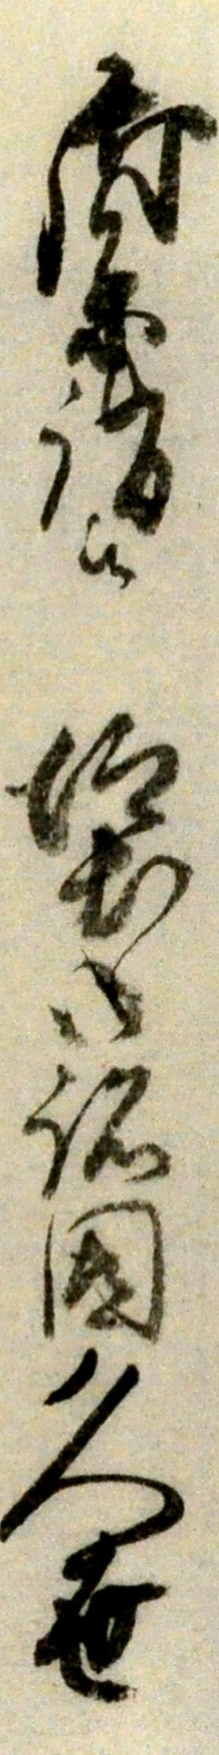御参詣被仰出御跡固久世
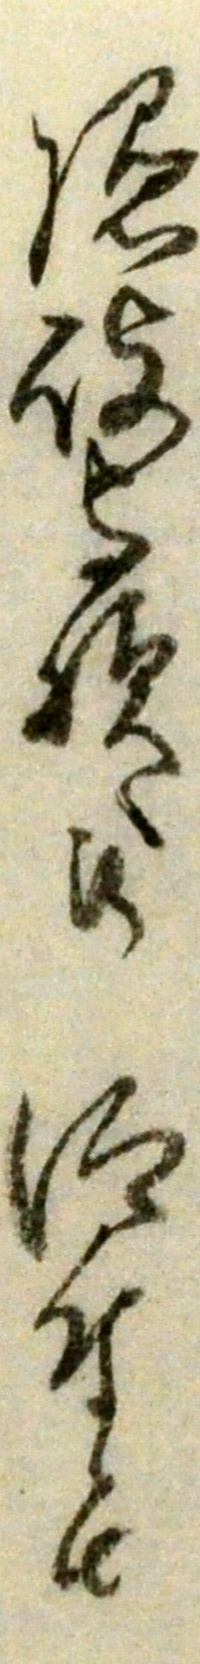隠岐守様へ被仰付候由
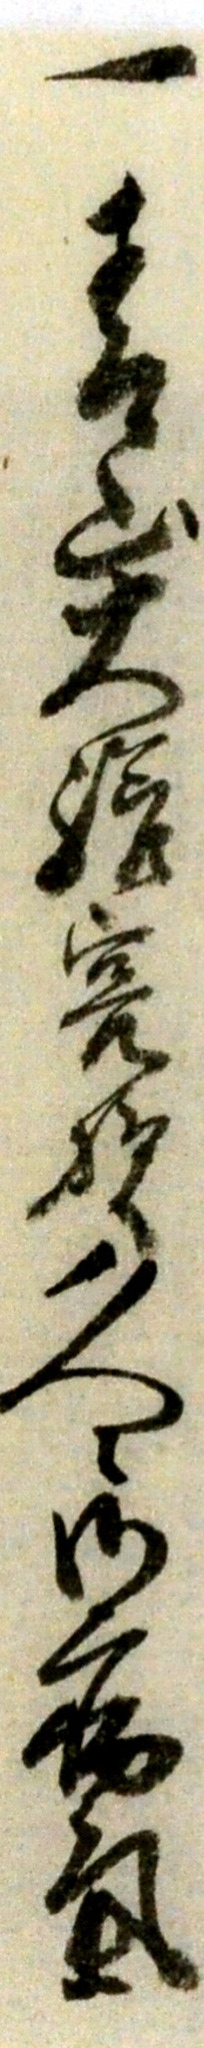一青山大膳亮様久々御病気
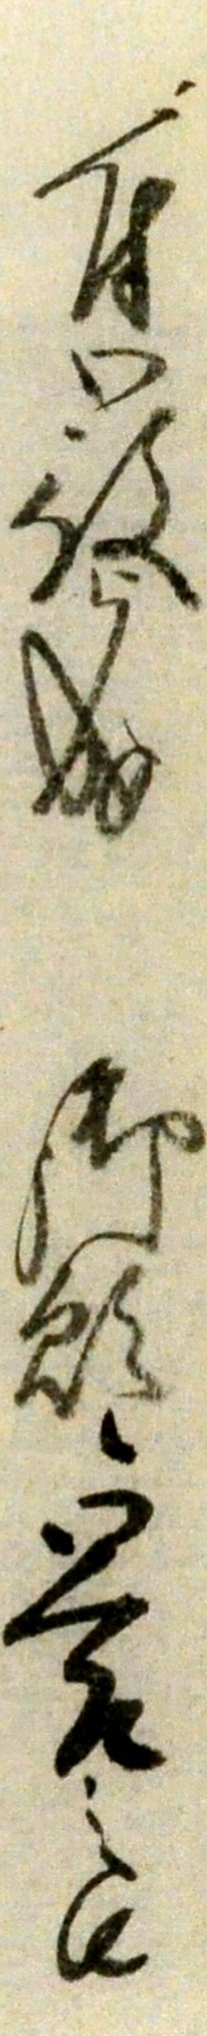に付御役被成御願候思召之由
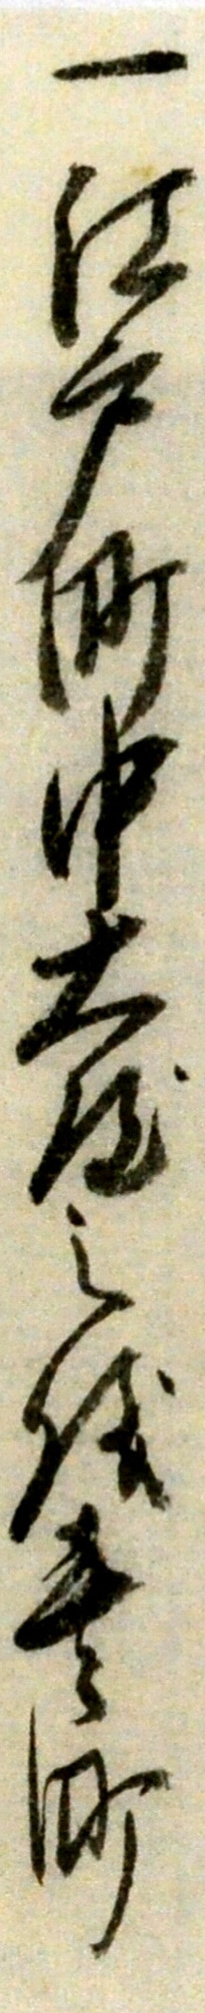一江戸町中土屋之儀壱町
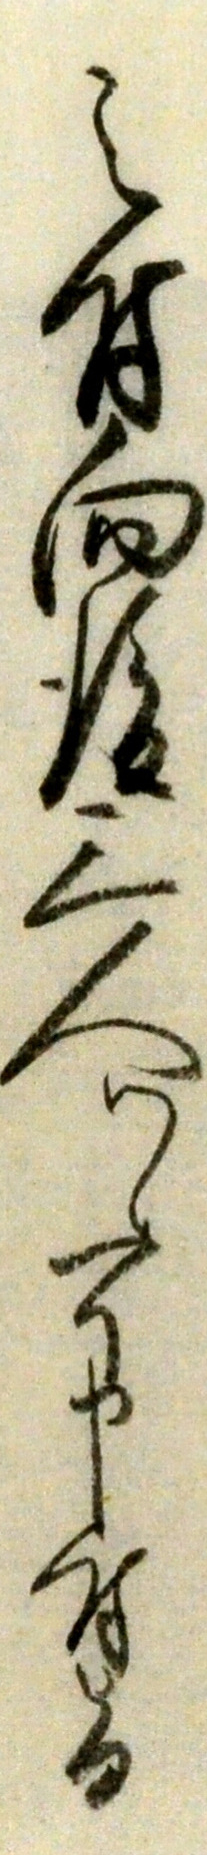に付向後三人ツヽ可申付旨
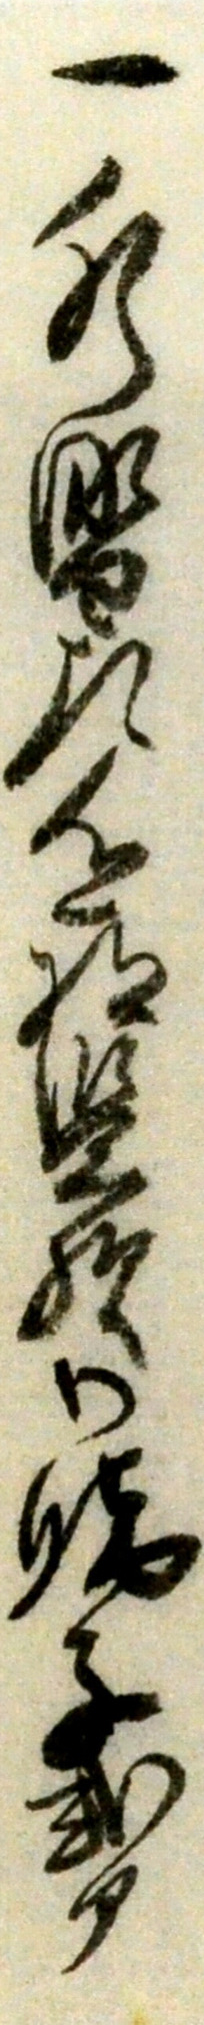一水野左近将監様御嫡子式部
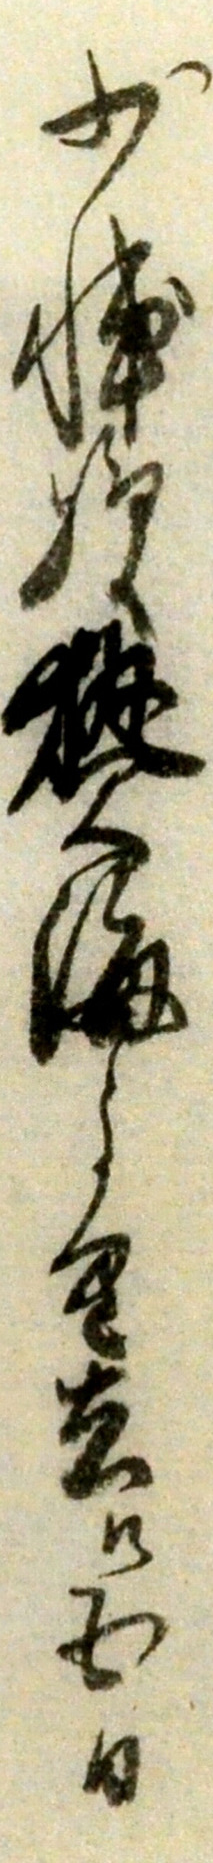少輔様熱海より去ル七日
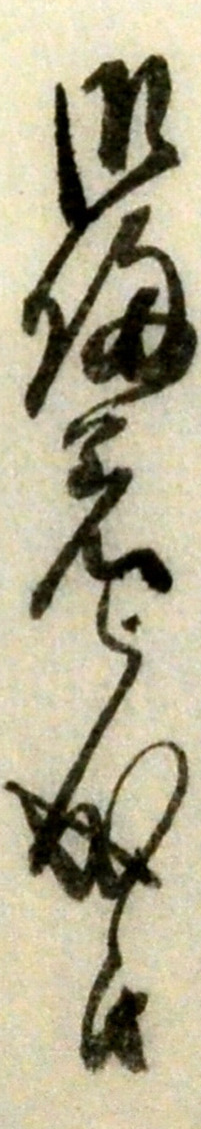御帰着被成候由

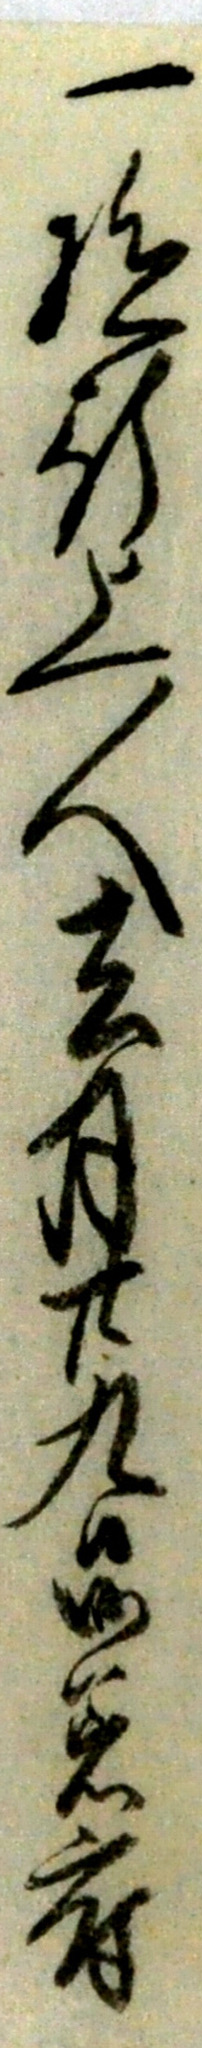一遊行上人去月二十九日御着府
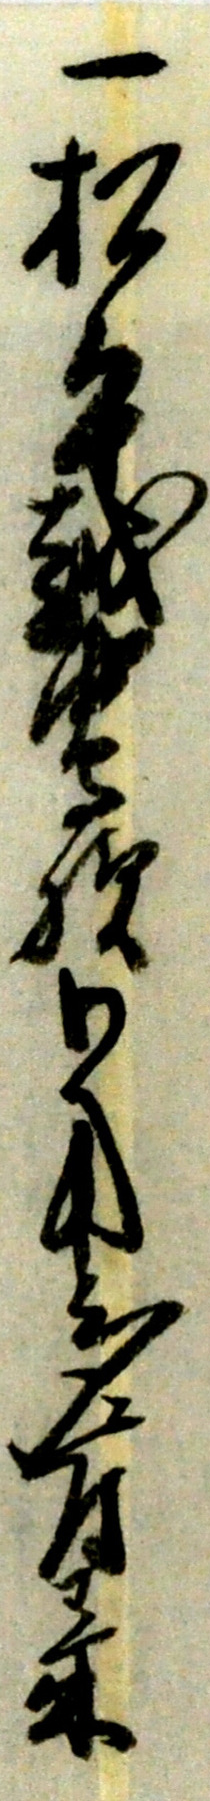一松平越中守様御用多に付
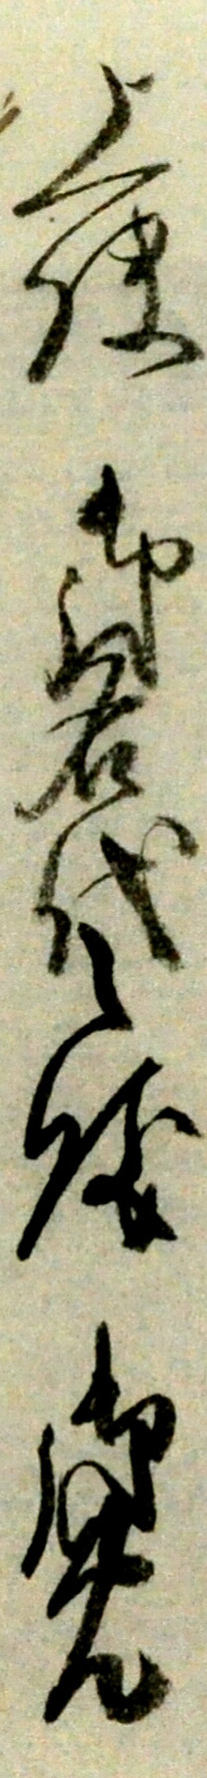上使御名代之儀御免
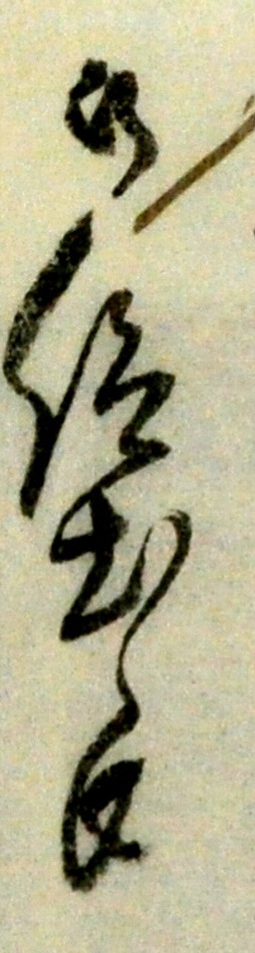被仰付候由
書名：申合帳〔一括〕
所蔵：伊那市立高遠町図書館・合同会社AMANE
